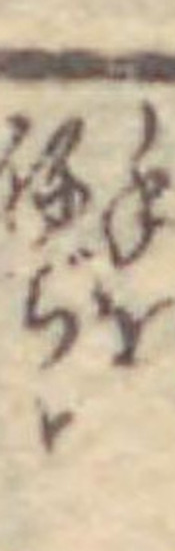ねぢり
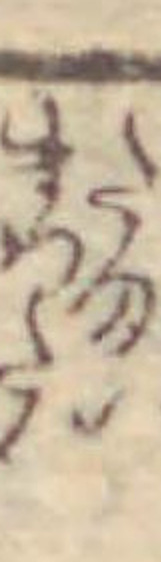まつたく
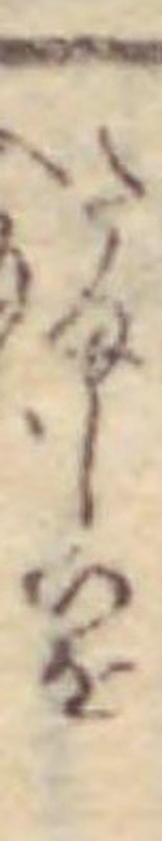たましいを
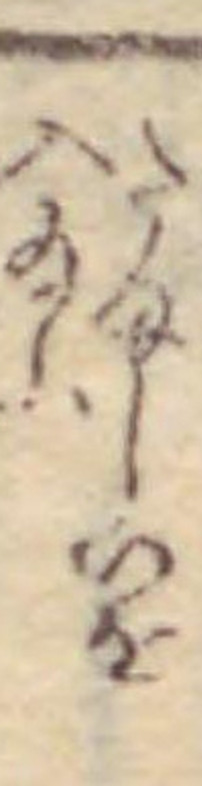たましいを
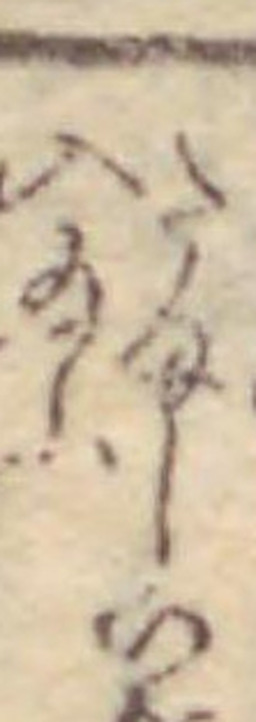入給ふ
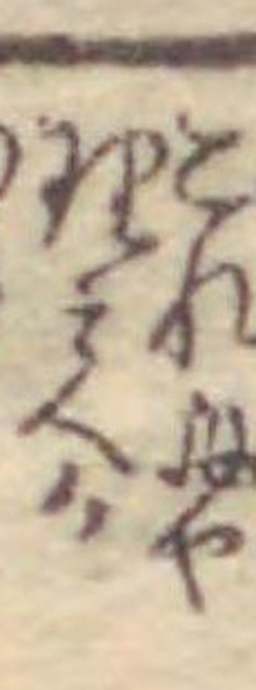理兵へか
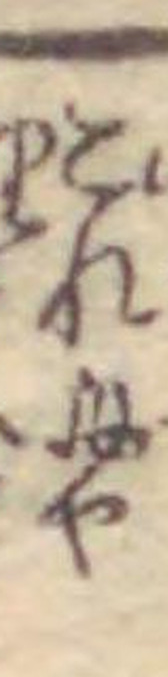これおや
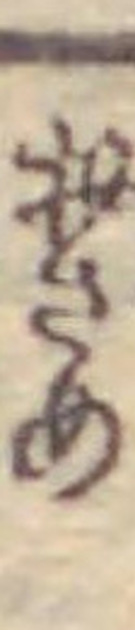おさめ
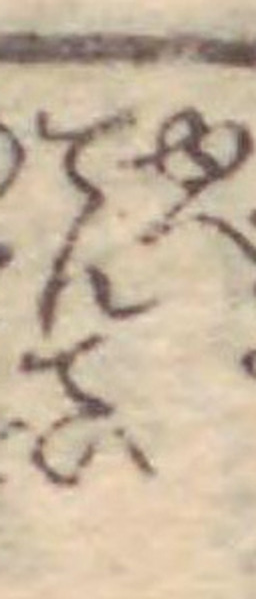てんてい
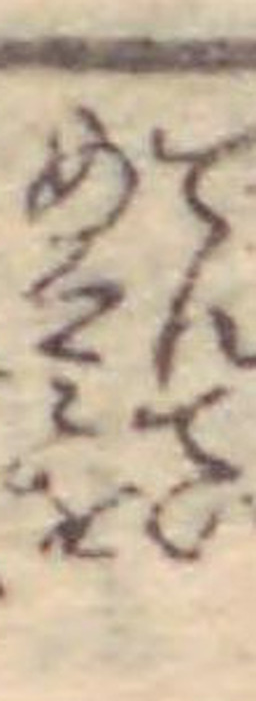めくみを
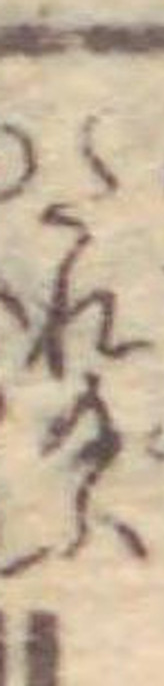たれ給ふ
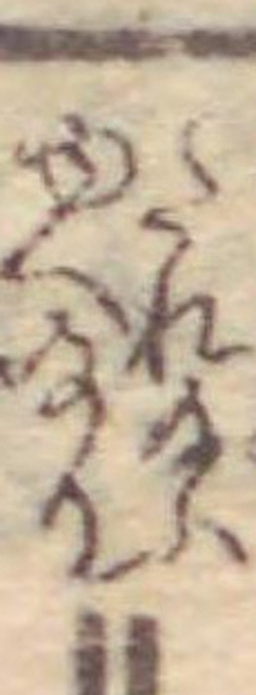ゆへなり
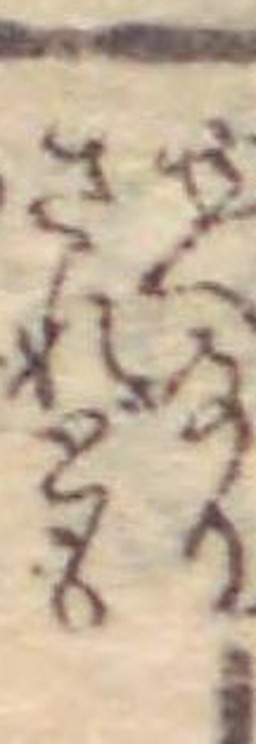されども
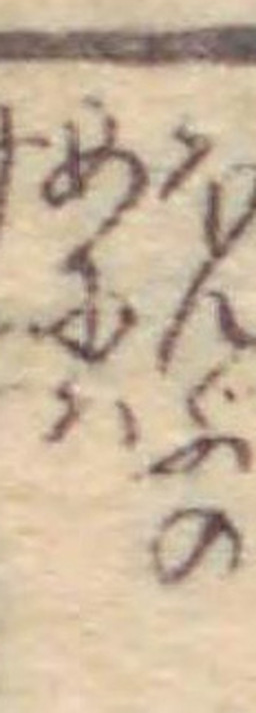めには
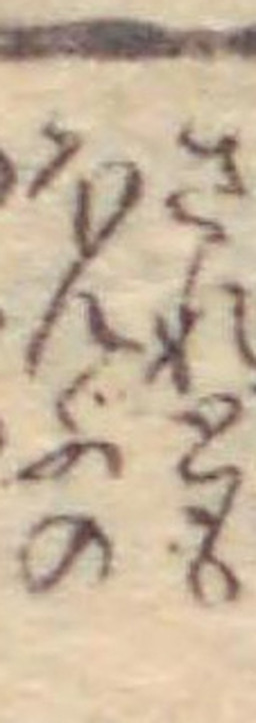ほんぶの
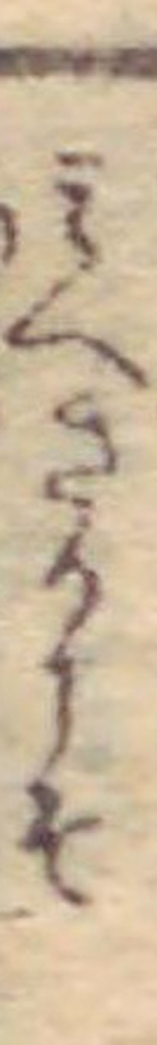みへさるこそ
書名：心学早染艸 : 3巻
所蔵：国立国会図書館 National Diet Library, JAPAN
